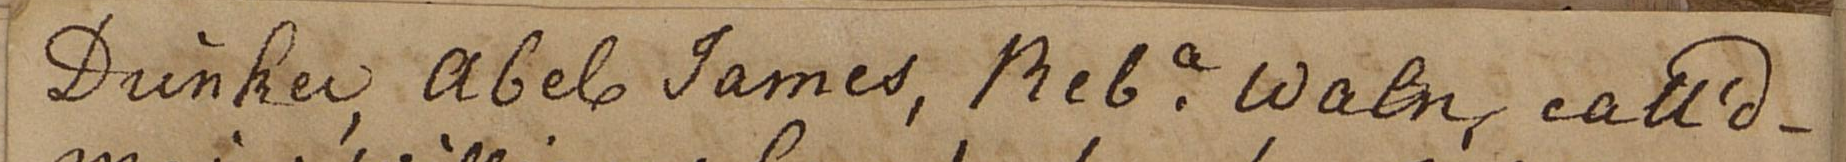Drinker, Abel James, Reb^a. Waln, call'd-
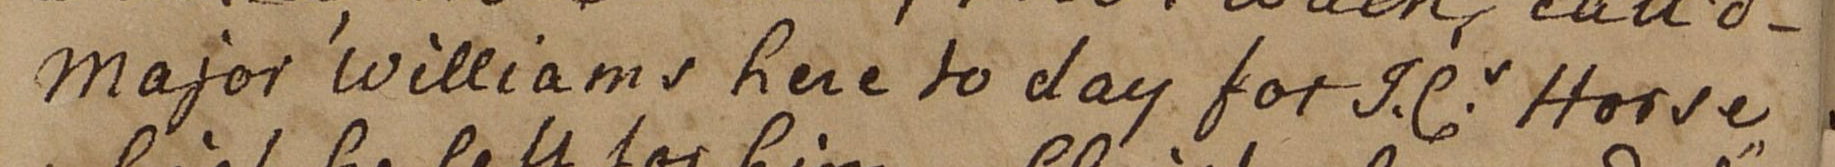Major Williams here to day for J.C^s. Horse,
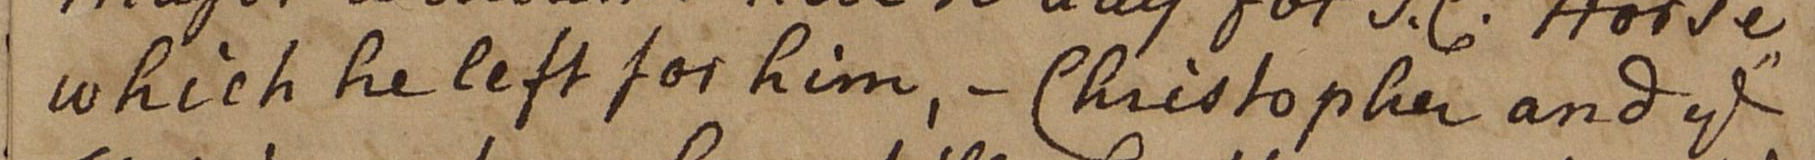which he left for him,- Christopher and y^e
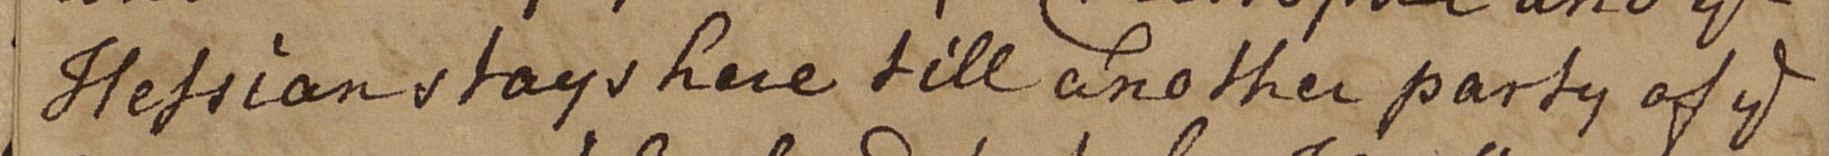Hessian stays here till another party of y^e
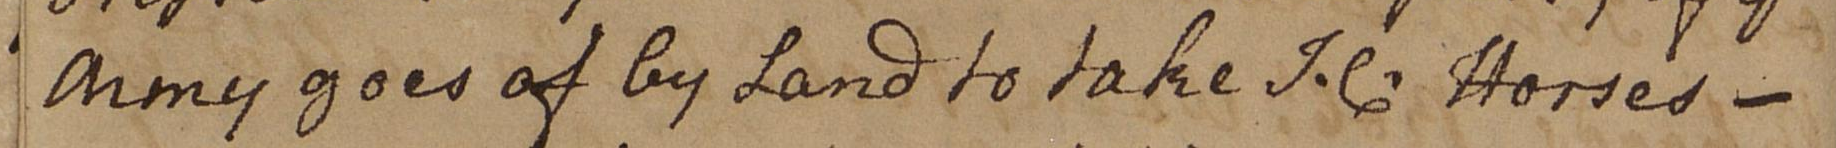Army goes of by Land to take J.C. Horses-
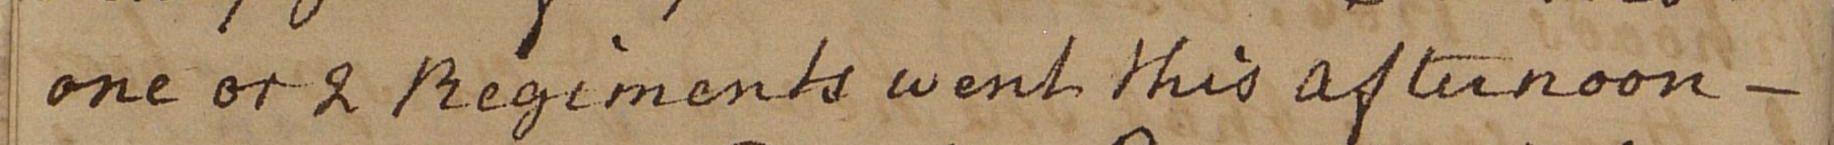one or 2 Regiments went this Afternoon-
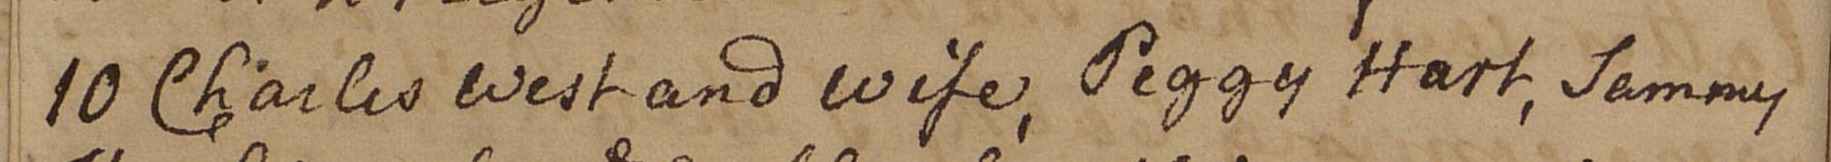10 Charles West and wife, Peggy Hart, Sammy
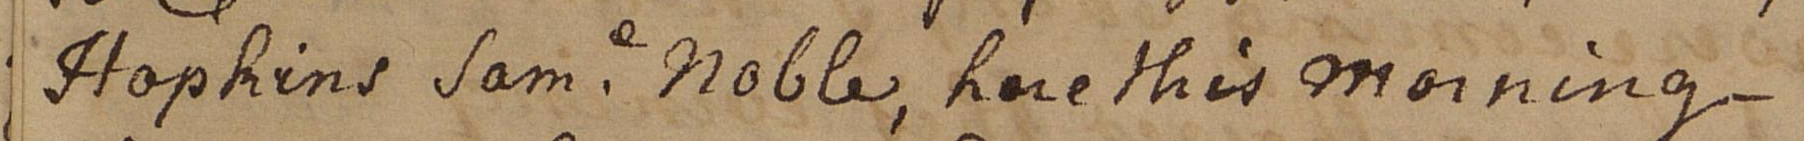Hopkins Sam^l. Noble, here this Morning-
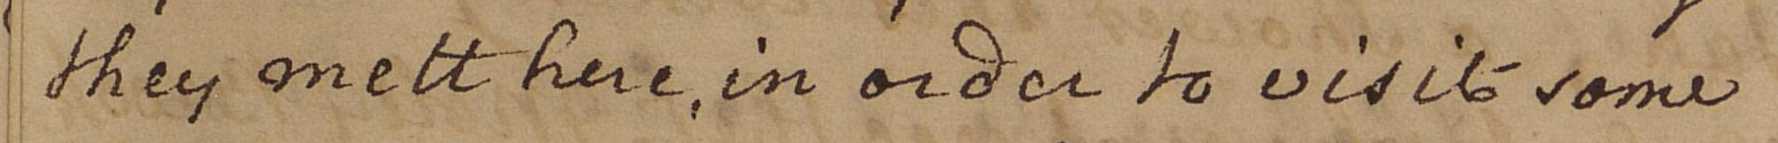they mett here in order to visit some
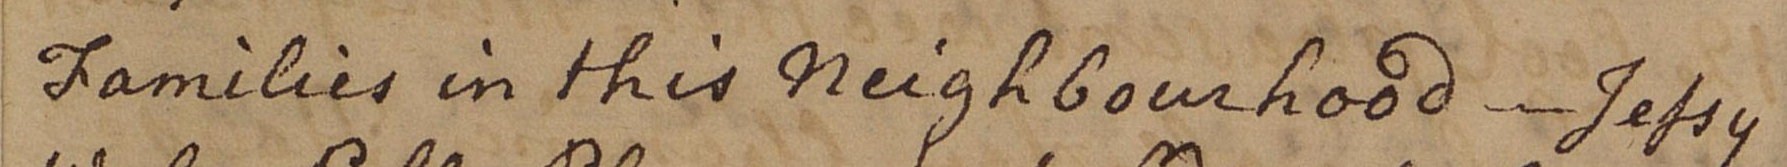Families in this Neighbourhood- Jessy
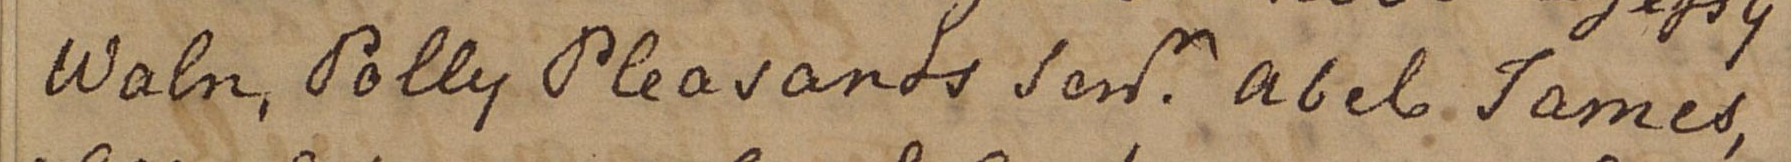Waln, Polly Pleasands Sen^r. Abel James,
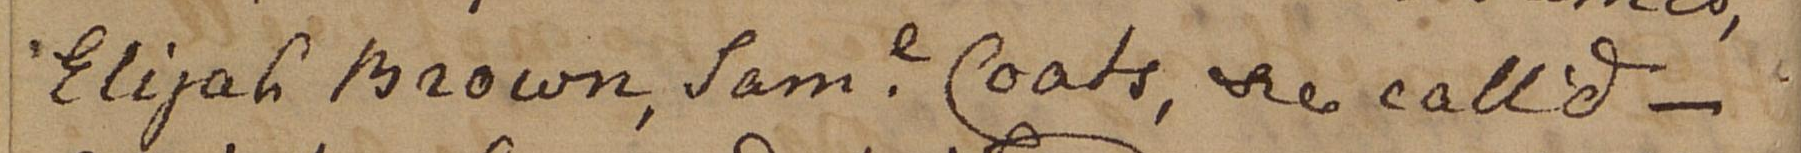Elijah Brown, Sam^l. Coats, &c call'd-
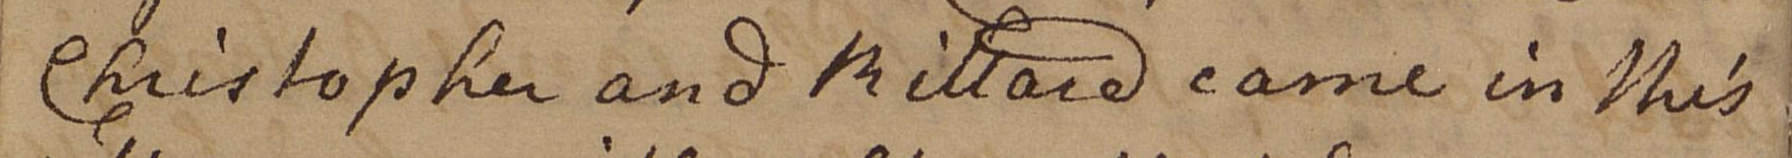Christopher and Rittard came in this
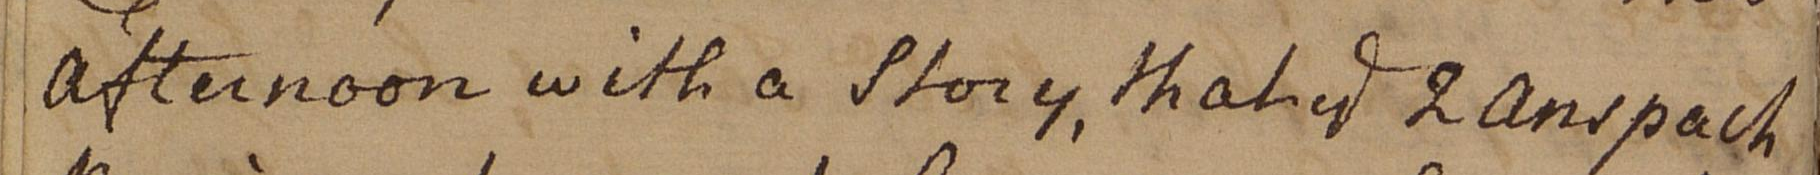Afternoon with a Story, that y^e 2 anspach
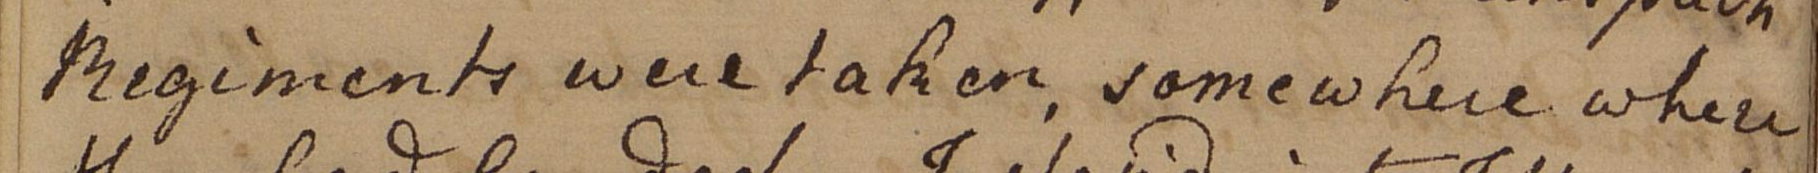Regiments were taken, somewhere where
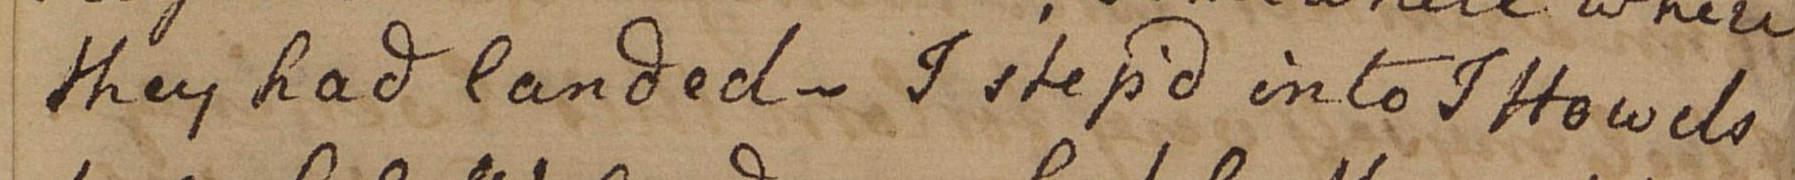they had landed- I step'd into T Howels
